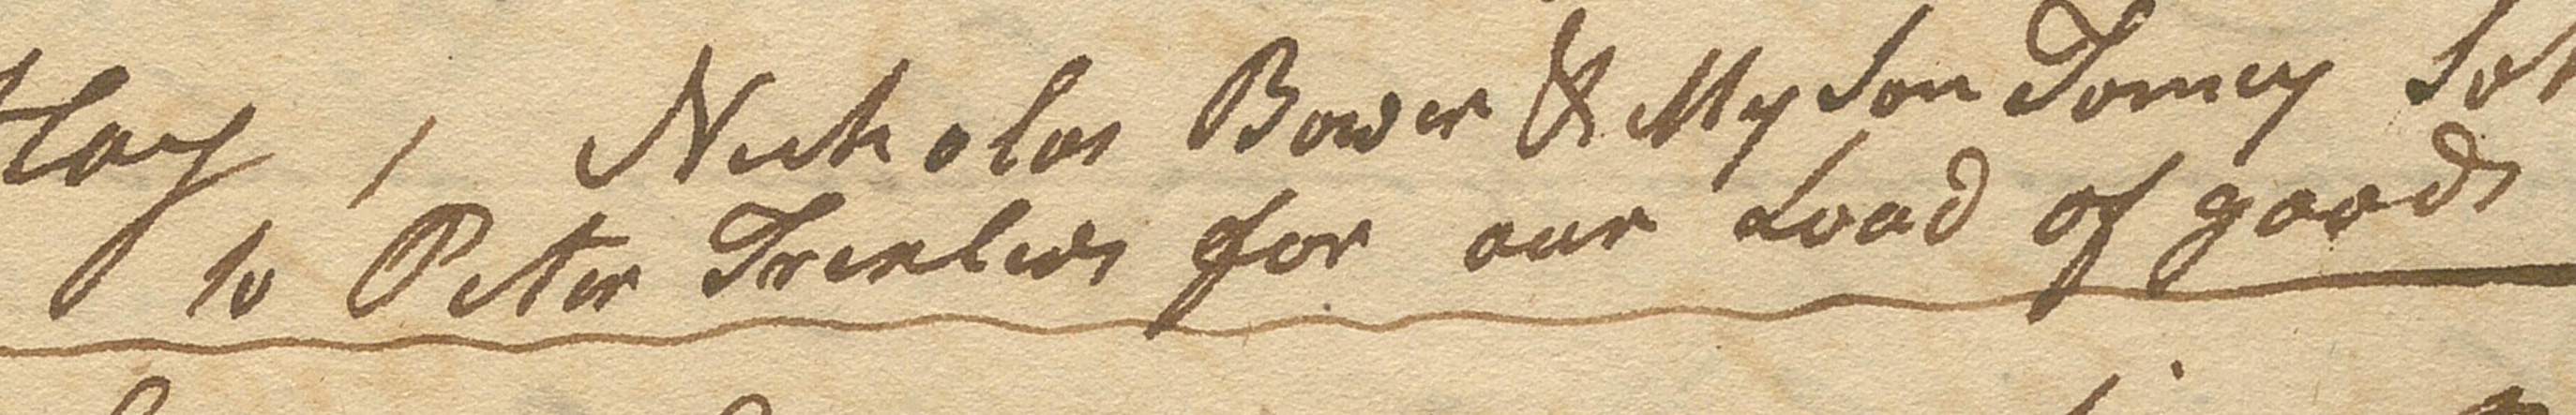to Peter Trenlers for our Load of goods
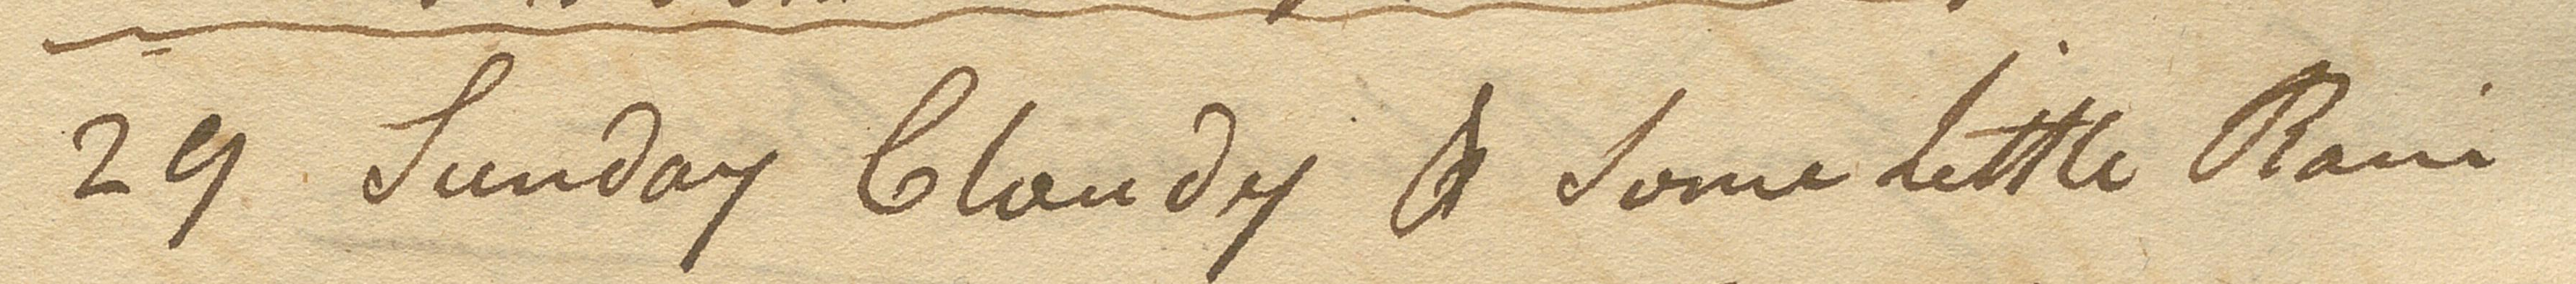29 Sunday Cloudy & some Little Rain
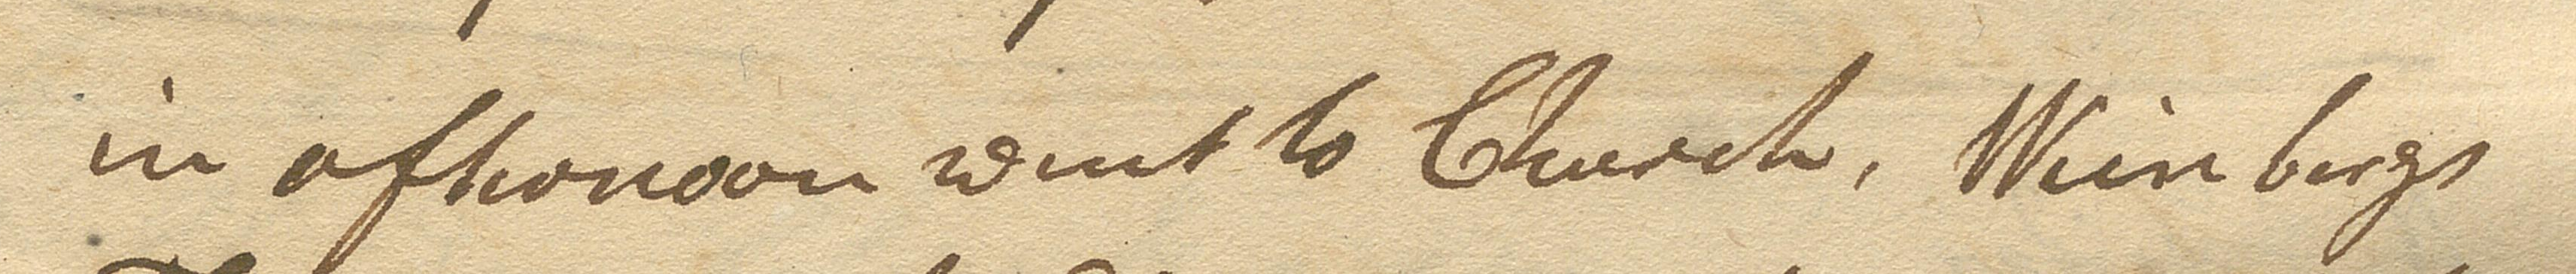in afternoon went to Church, Weinbergs
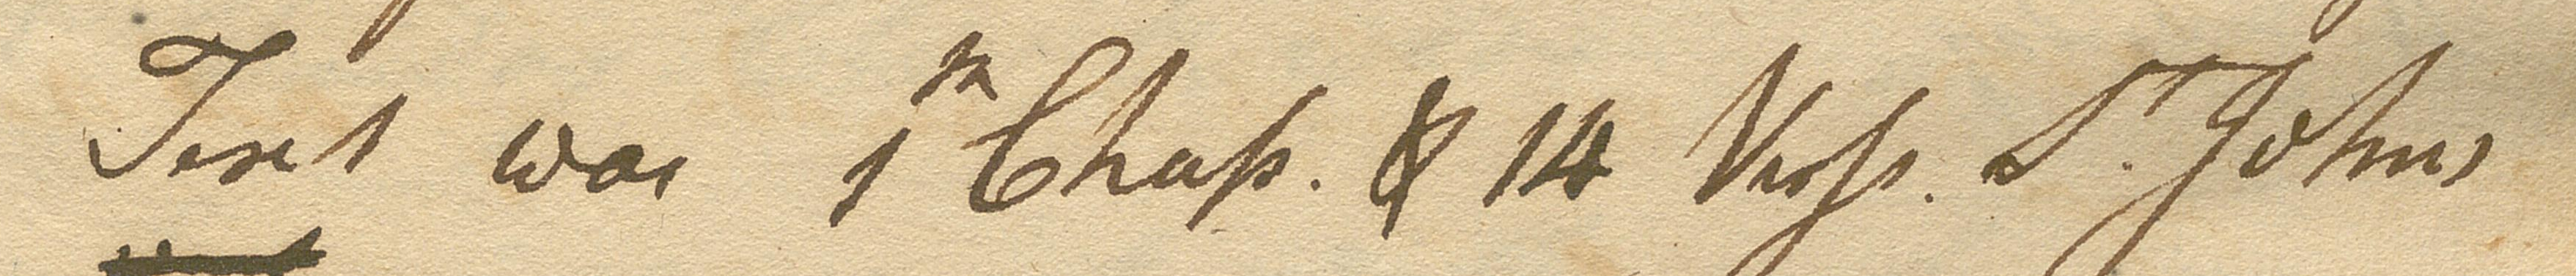Text was 1^th Chap. & 14 Verss. S^t. Johns
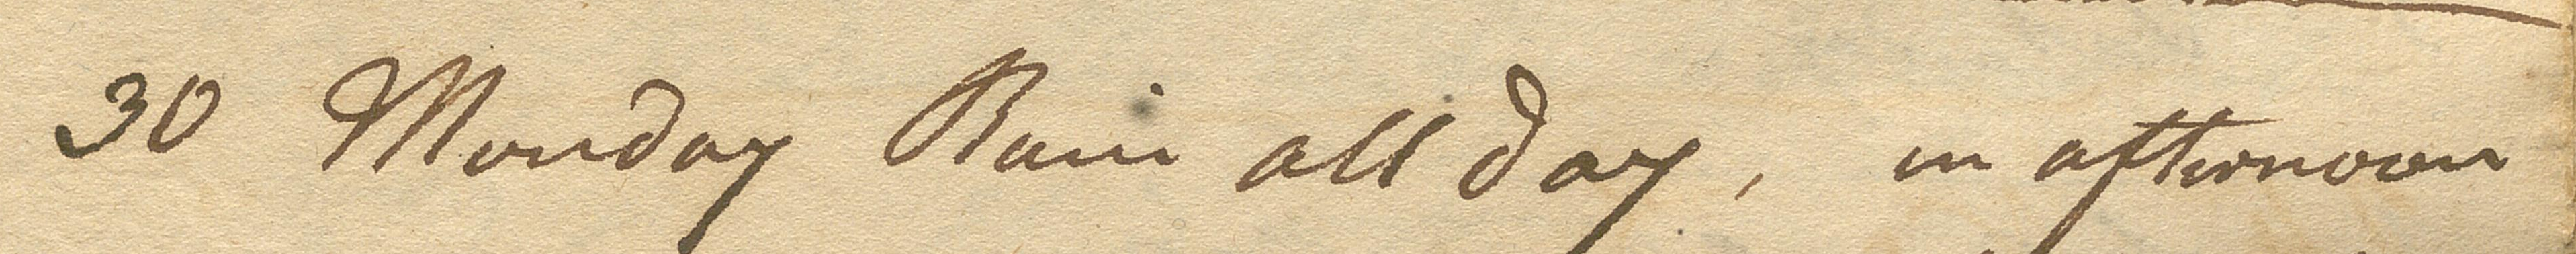30 Monday Rain all day, in afternoon
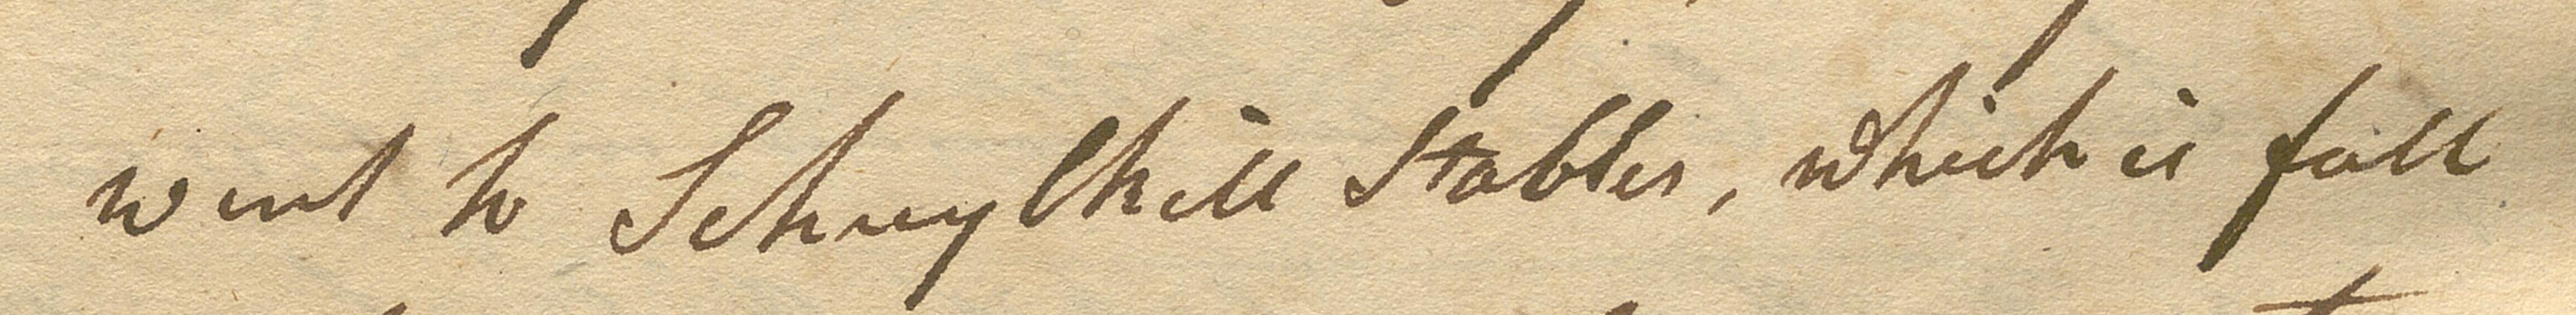went to Schuylkill Stables, which is fall
